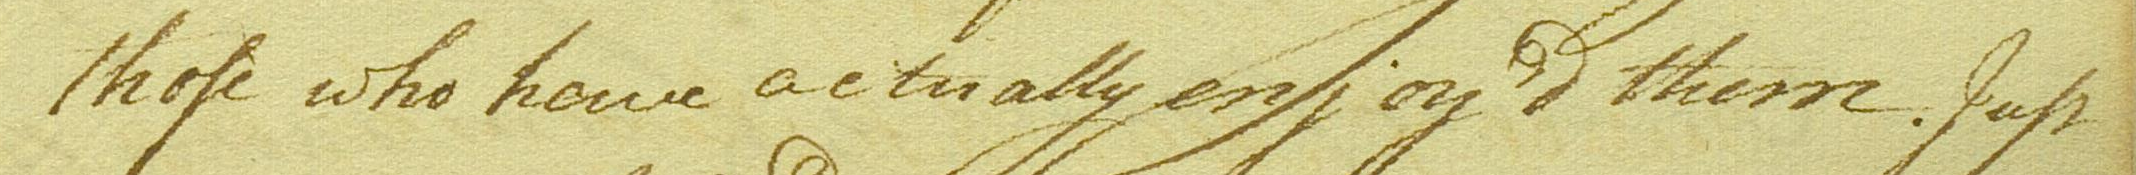those who have actually enjoy'd them. Just
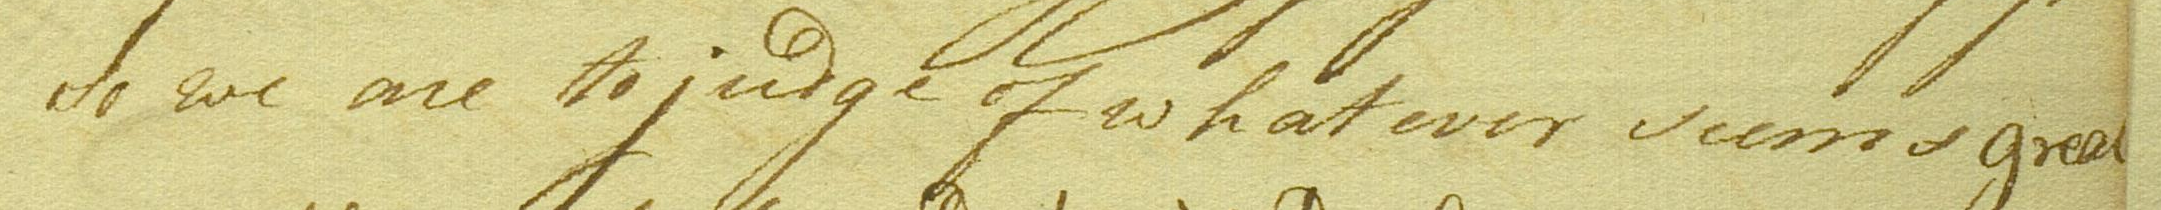so we are to judge of whatever seems great
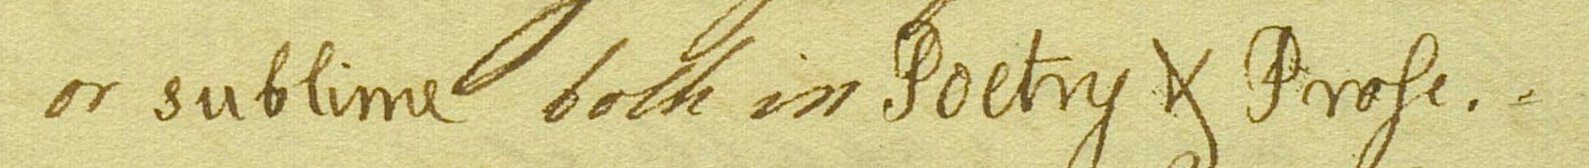or sublime both in Poetry & Prose.
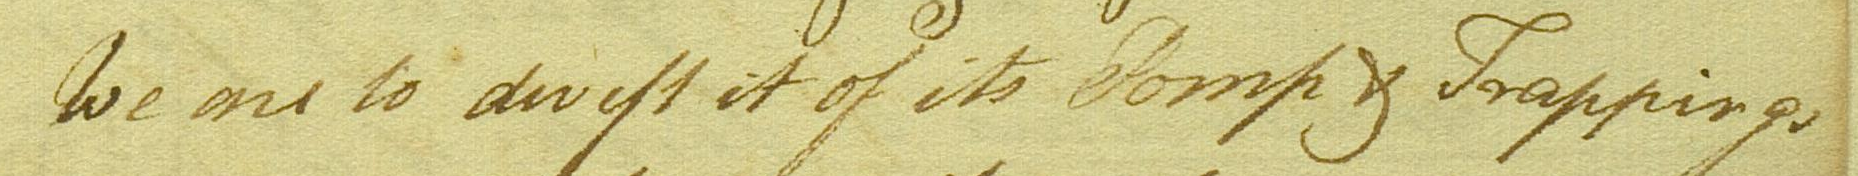We are to divest it of its Pomp & Trappings
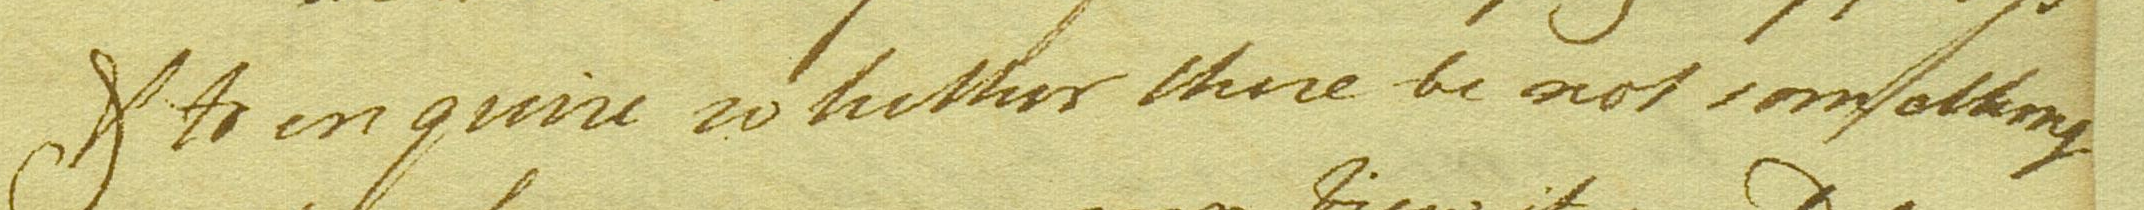& to enquire whether there be not something
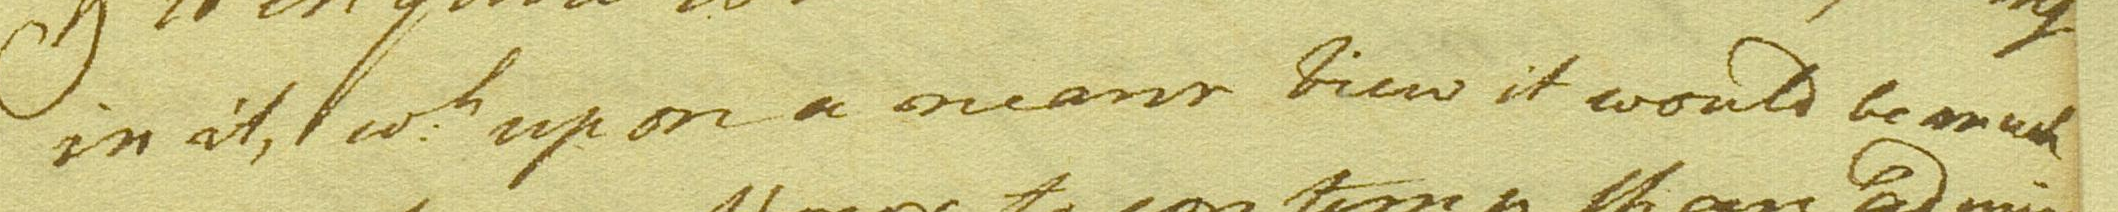in it, w^h: upon a near view it would be much
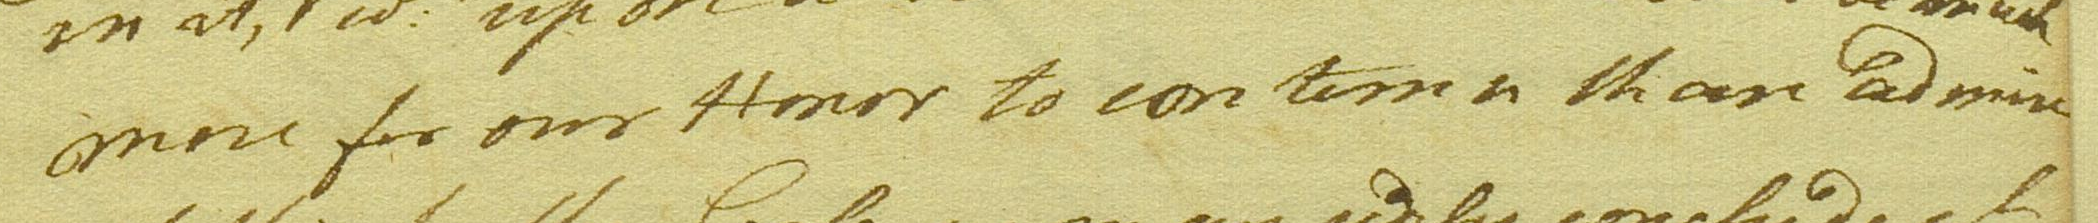more for our Honor to contemn than admire
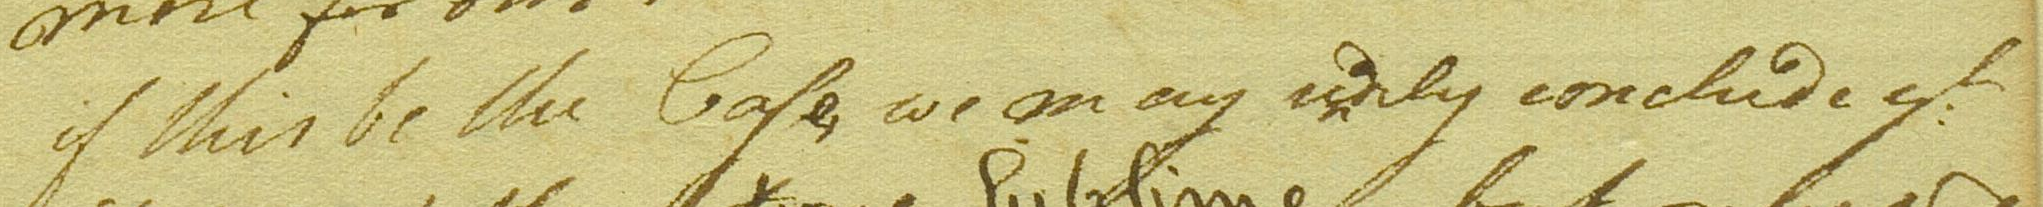if this be the Case, we may ne^arly conclude y^t:
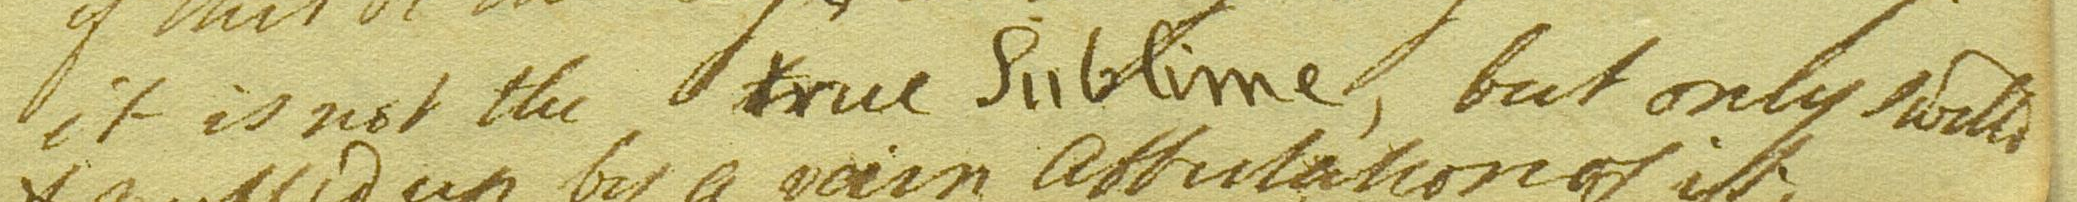it is not the true Sublime, but only swelld
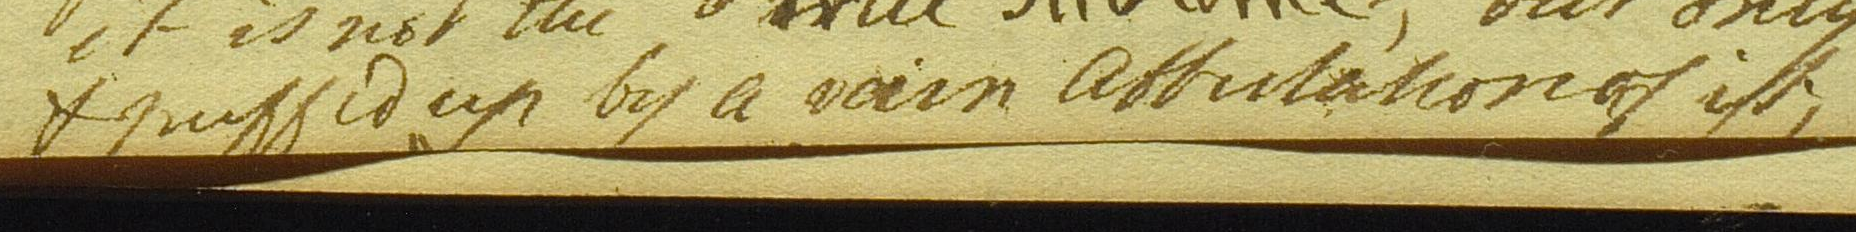& ruffld up by a vain Affectation of it,
